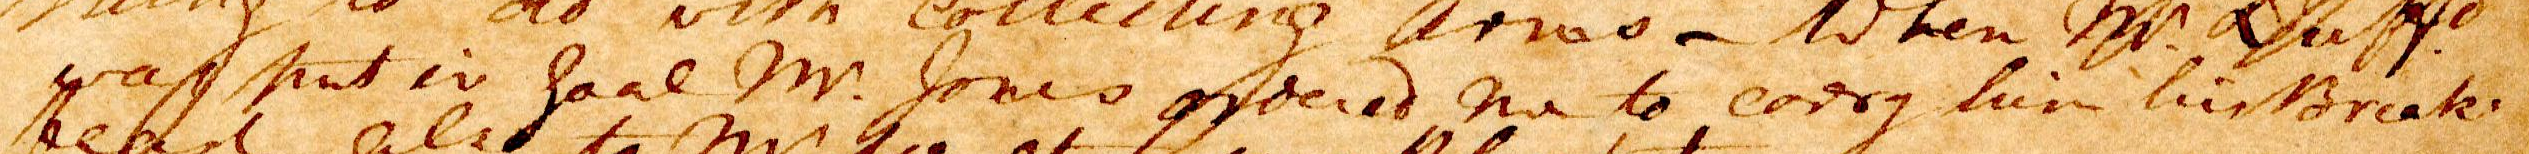was put in Goal M^r. Jones ordered me to carry him his Break-
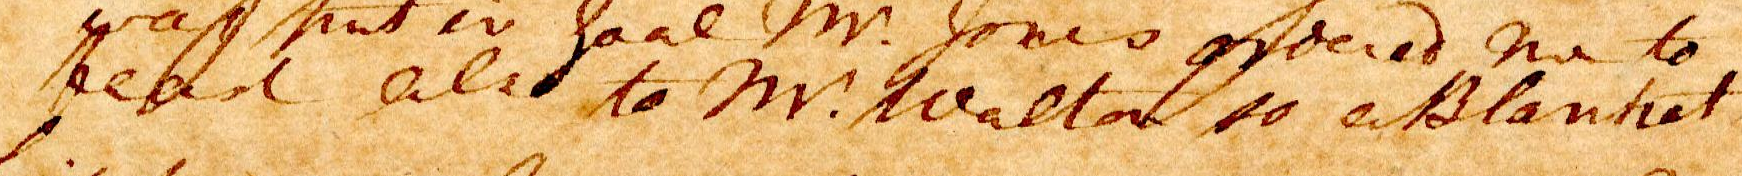feast also to M^r. Walton so a Blanket
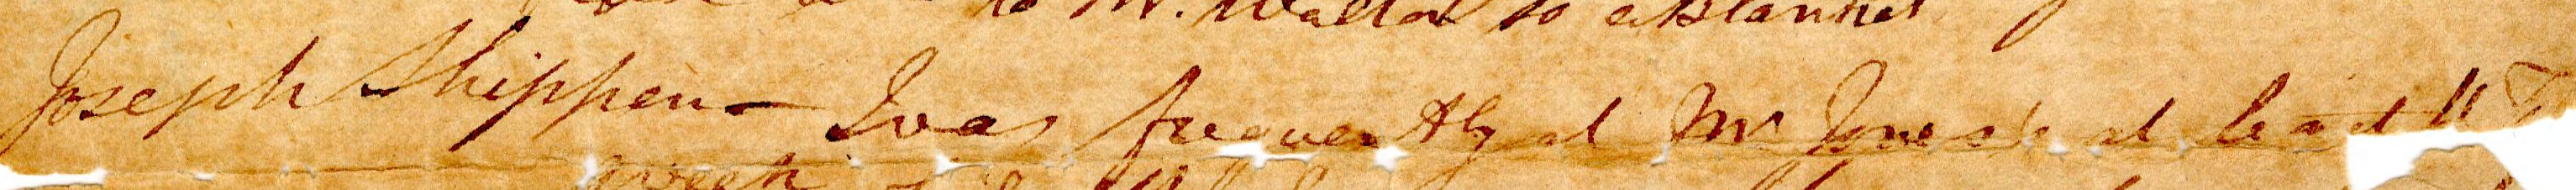Joseph Shippen - I was frequently at M^r Jones at least 4
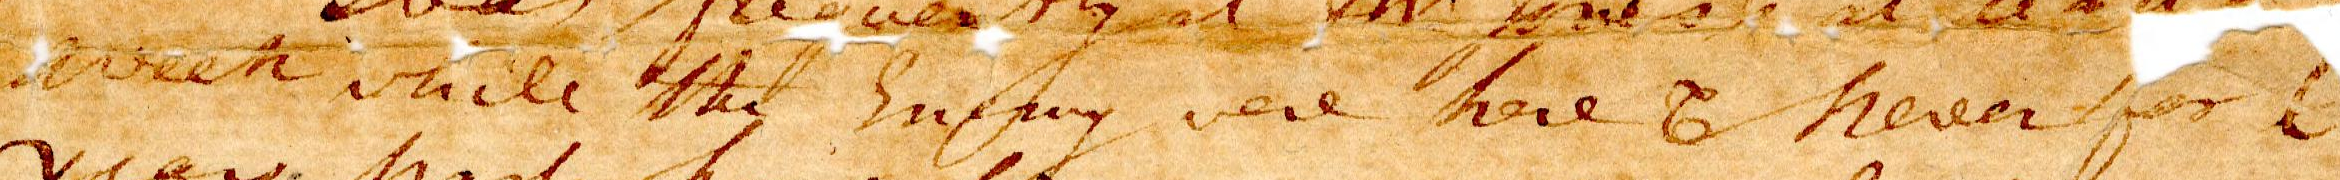week while the Enemy were here & never for 6
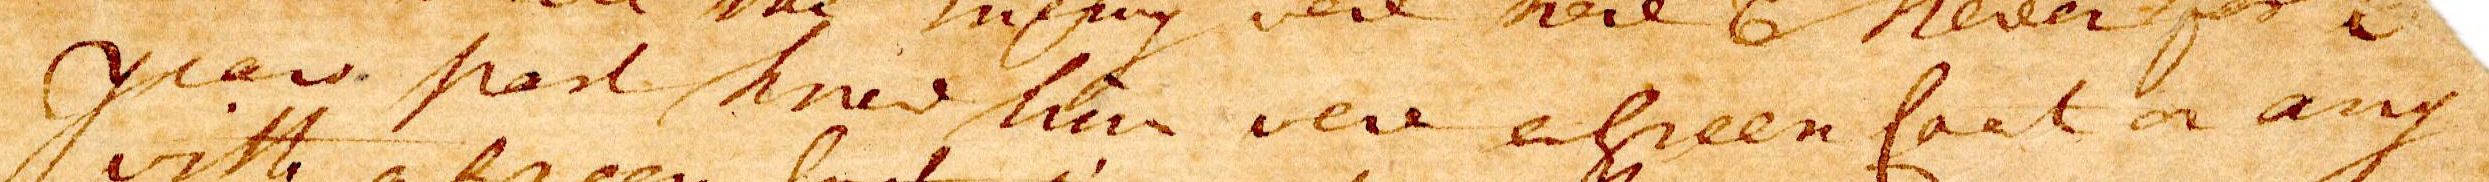years past knew him wear a Green Coat or any
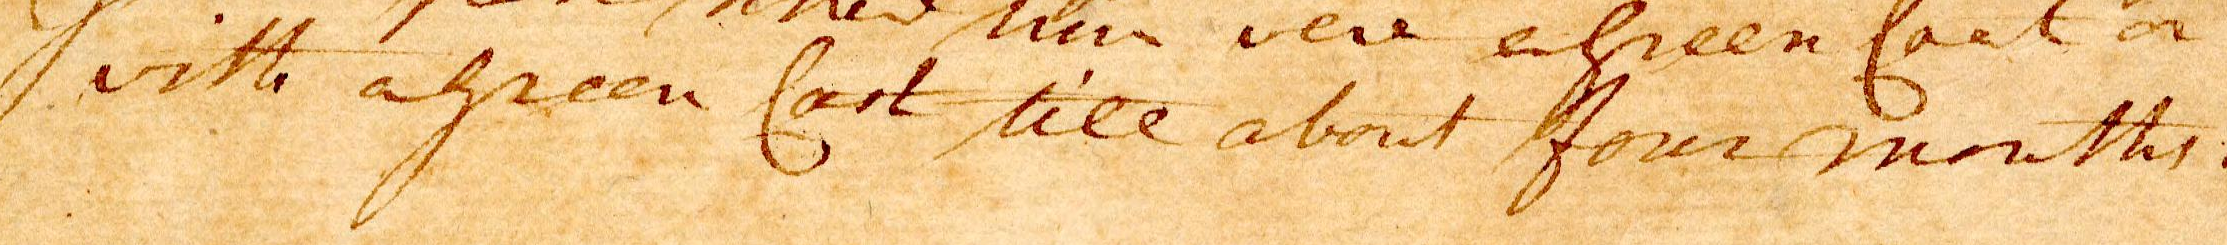with a green Coat till about four months
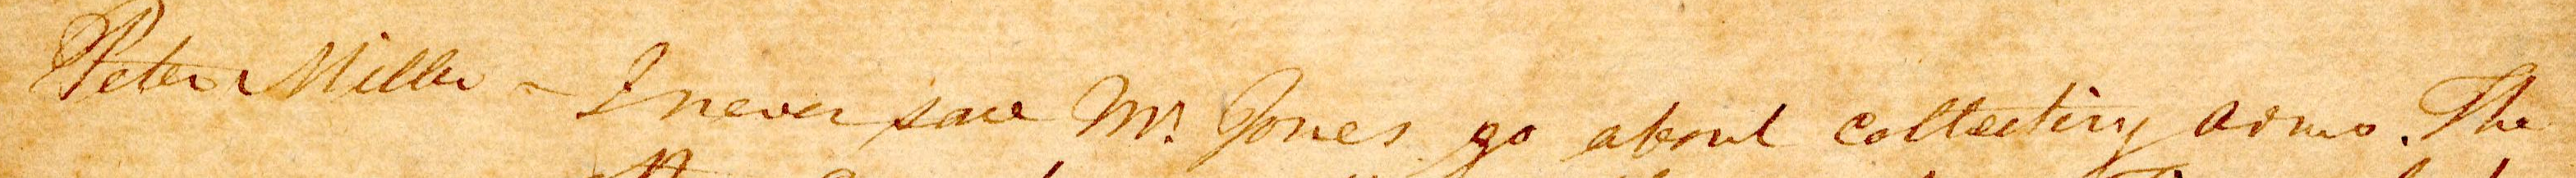Peter Miller – I never saw M^r. Jones go about collecting arms. The
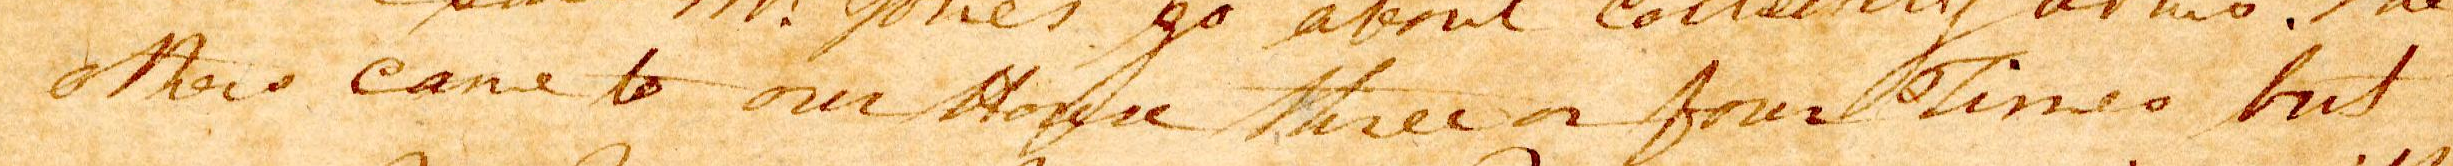others came to our House three or four Times but
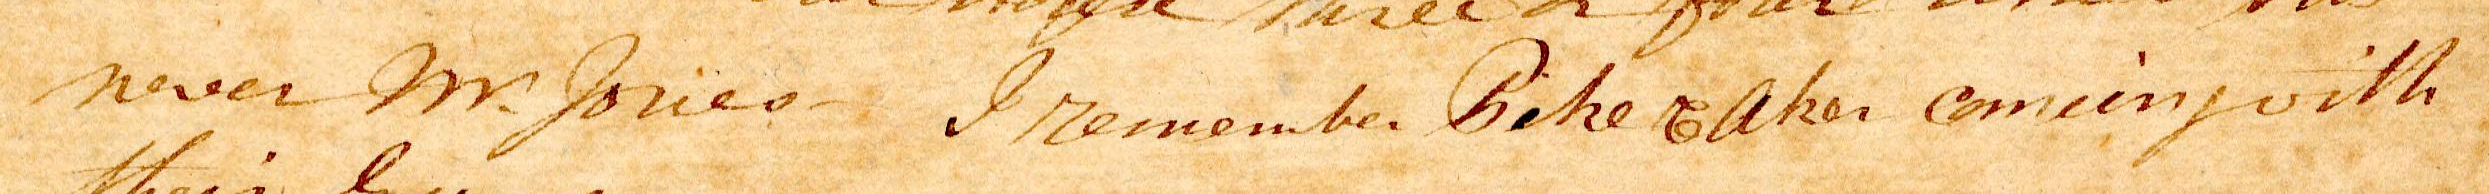never M^r Jones- I remember Pike & Aker coming with
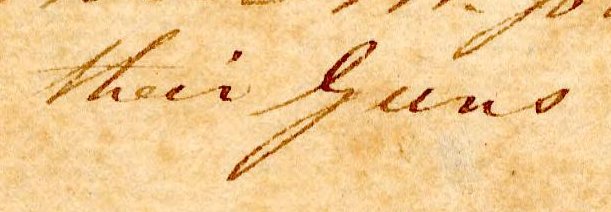their Guns
